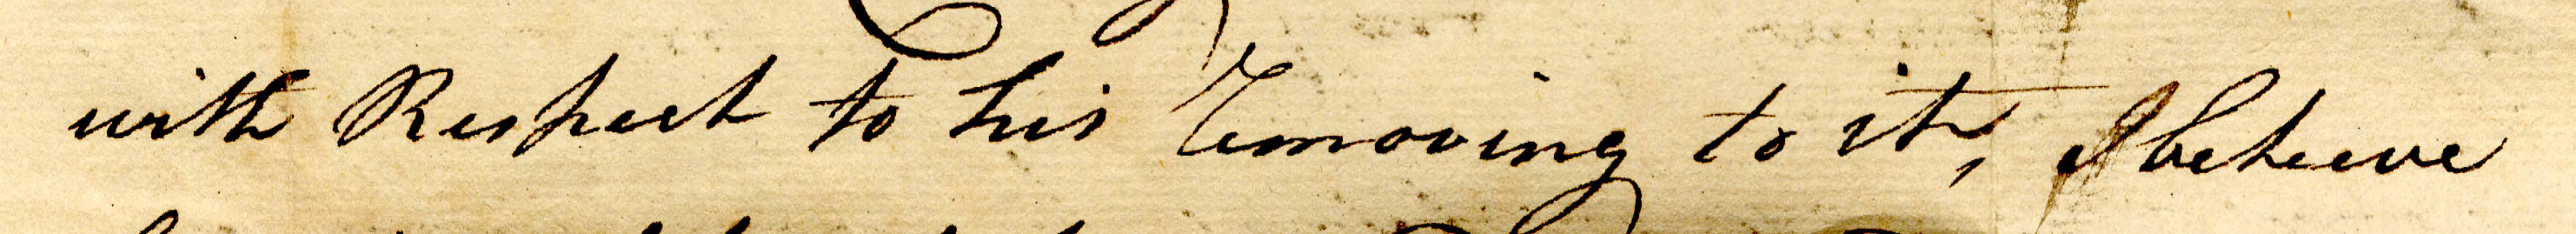with Respect to his removing to it, I believe
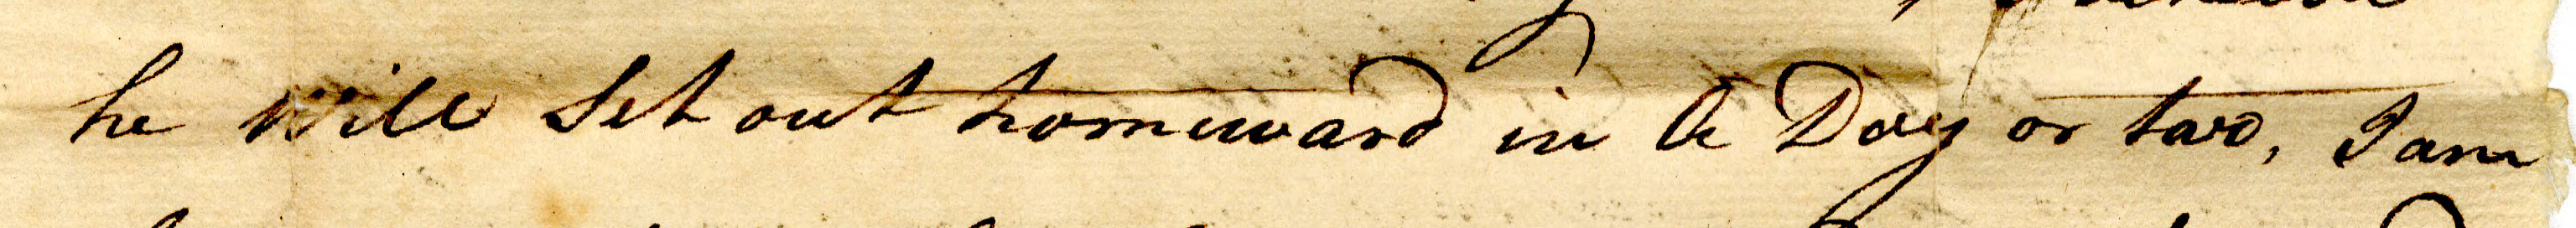he will set out homeward in a Day or two, I am
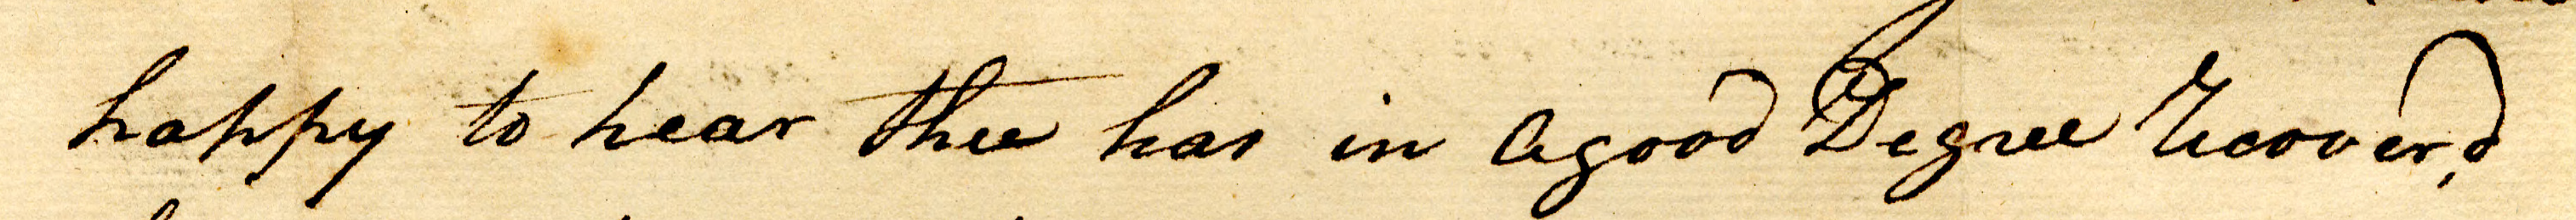happy to hear thee has in a good Degree recovr,d
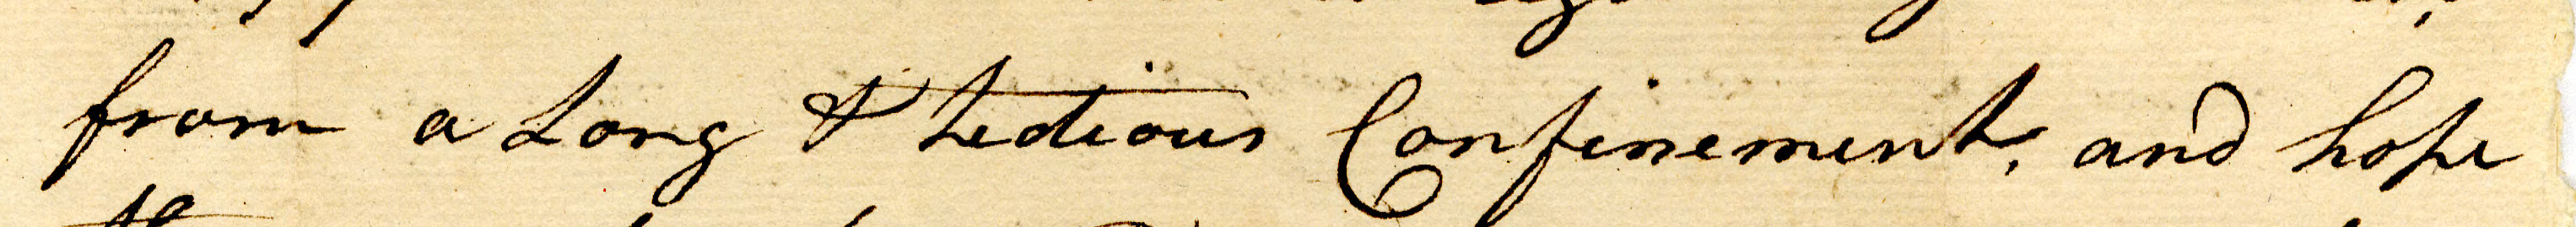from a Long & tedious Confinement, and hope
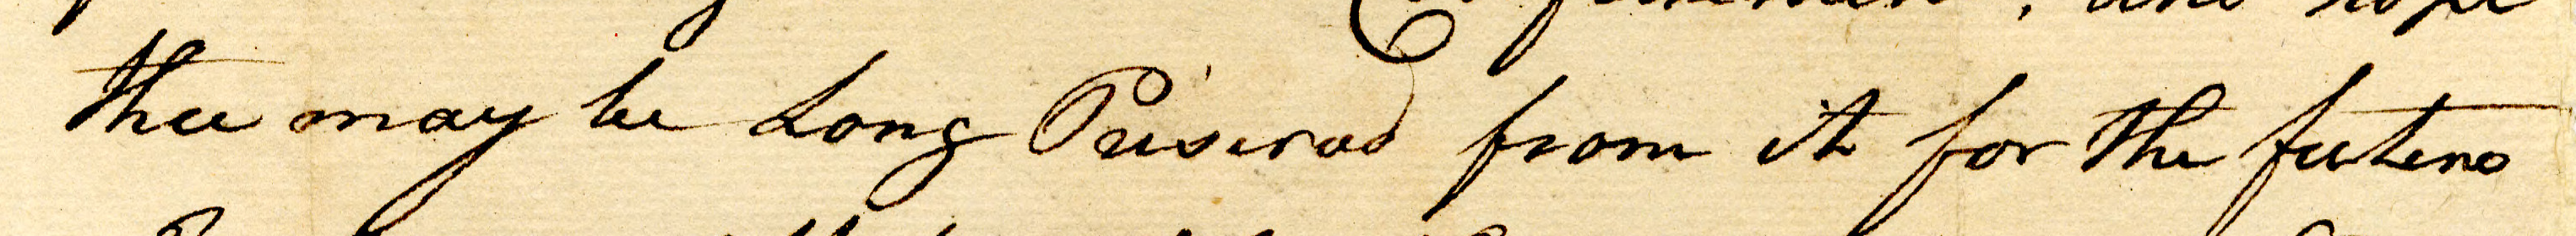thee may be Long Pusired from it for the future
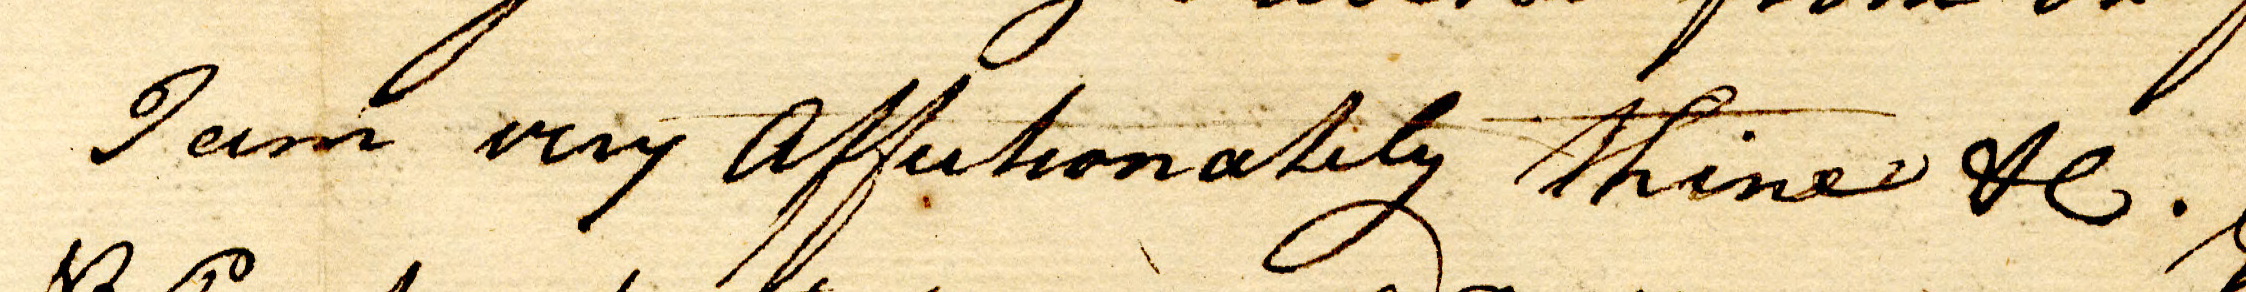I am very Affectionately thine &c.
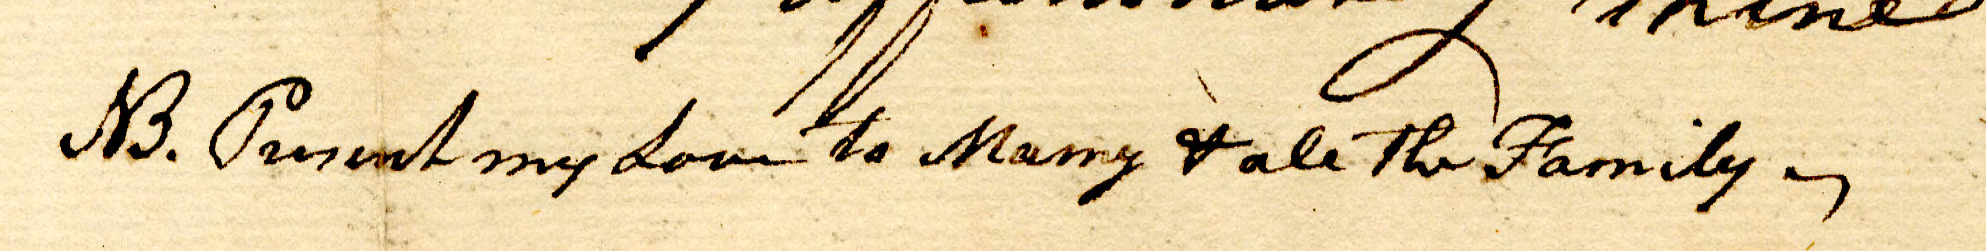NB. Present my Love to Marry & all the Family-
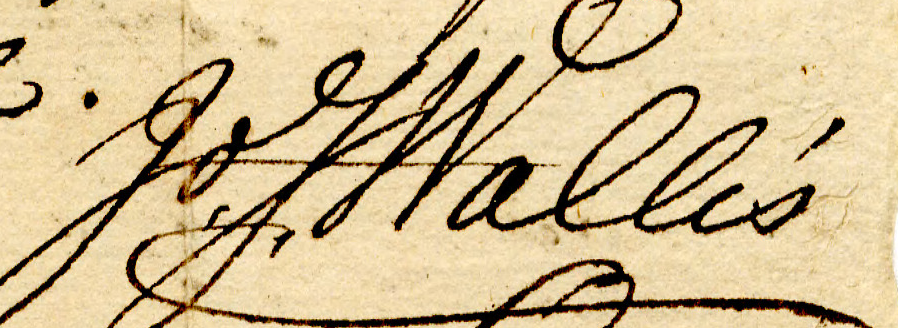Jo Wallis
